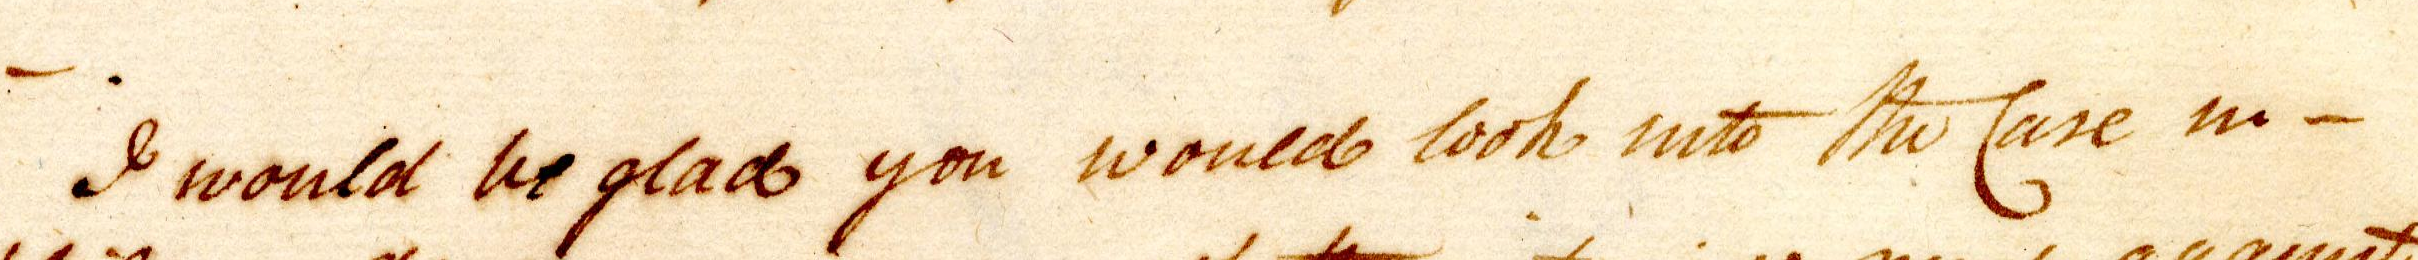I would be glad you would look into the Case in
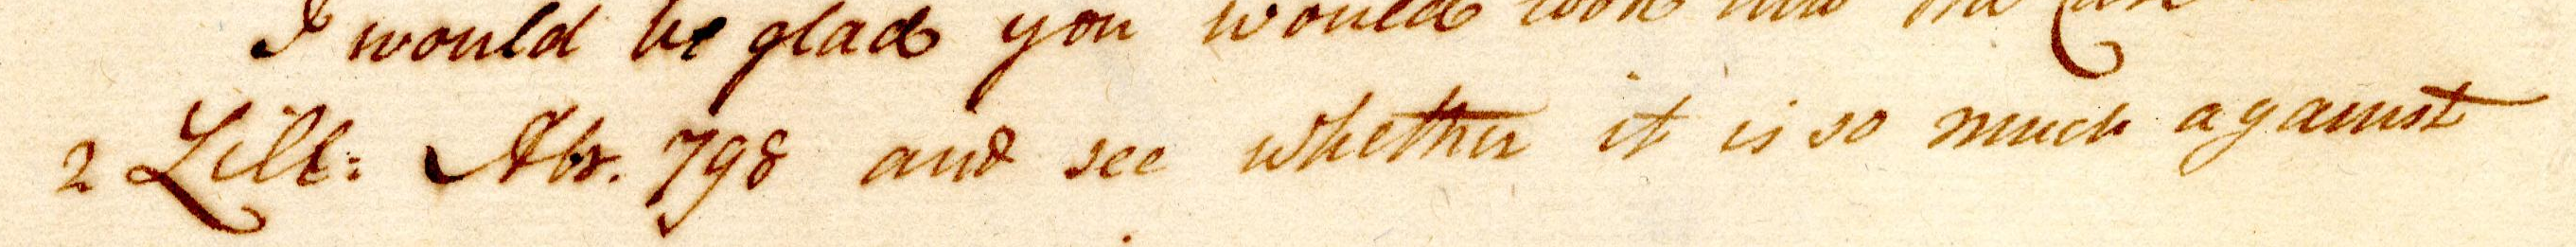2 Lill. Abr. 798 and see whether it is so much against
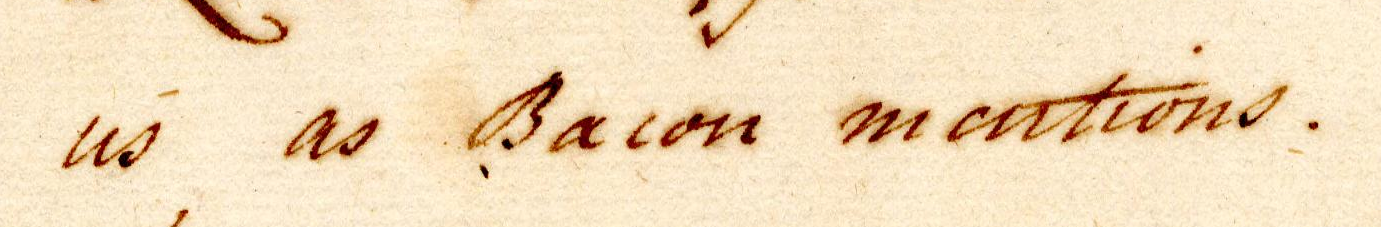us as Bacon mentions.
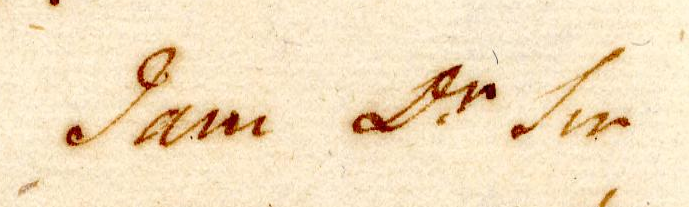I am D^r. Sir
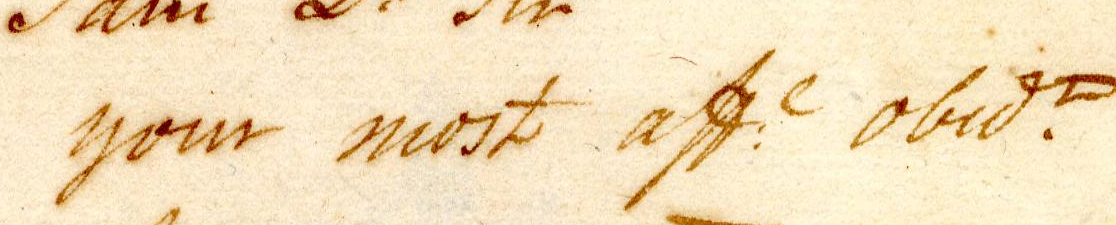your most aff^e. obed^t.
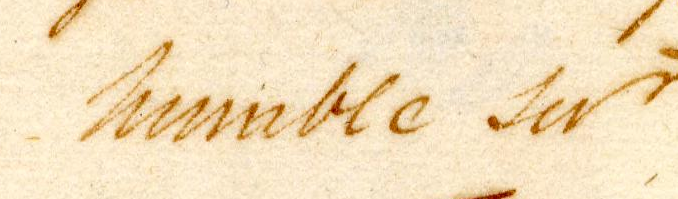humble Ser^t
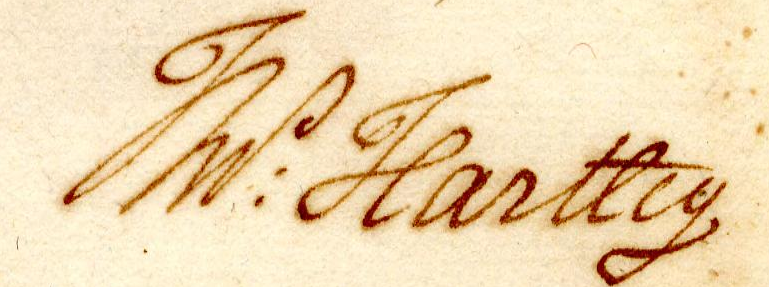Tho^s: Hartley
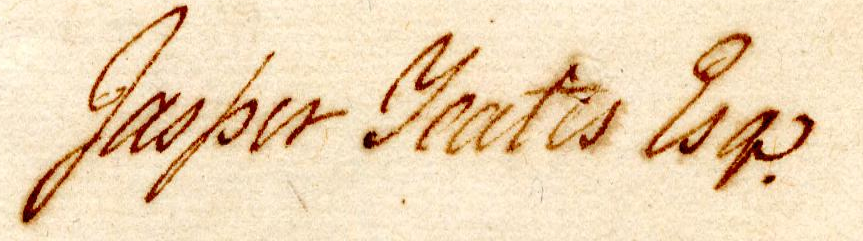Jasper Yeates Esq.
